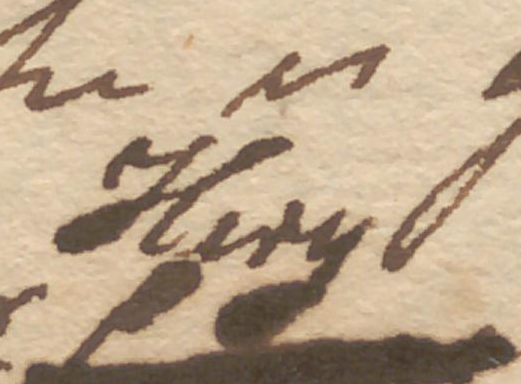Hery
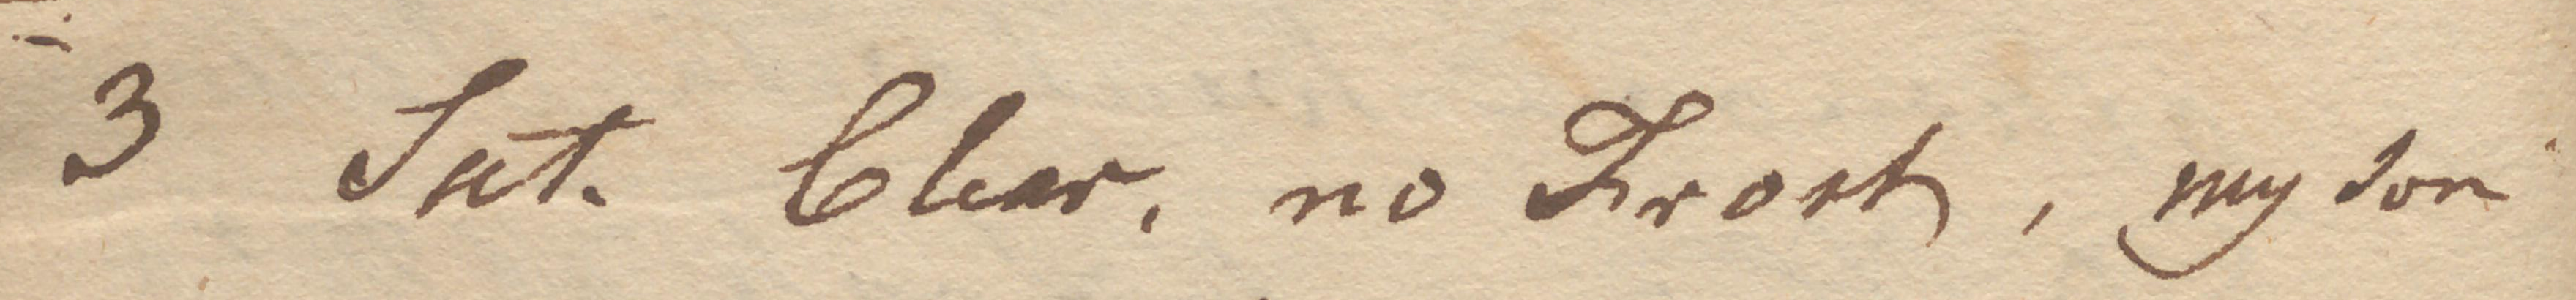3 Sat. Clear, no Frost, my son
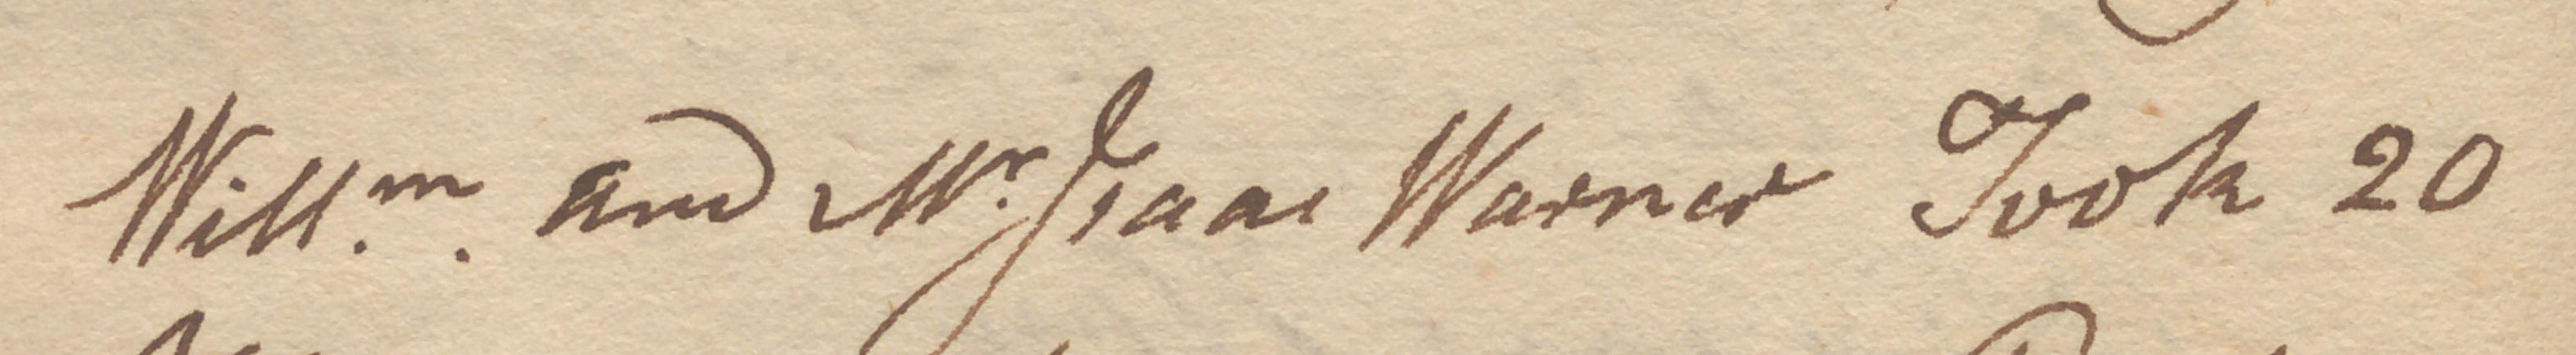Will^m. and M^r. Isaac Warner Took 20
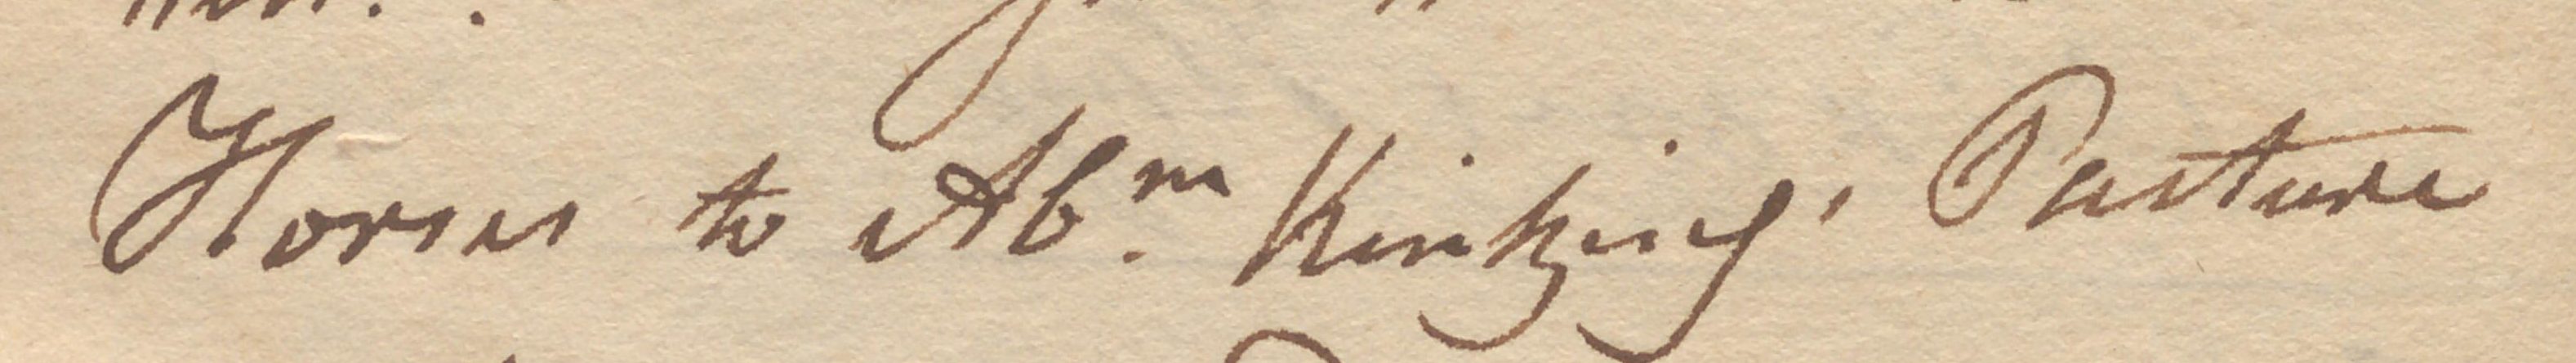Horses to Ab^m. Kintzings Pasture
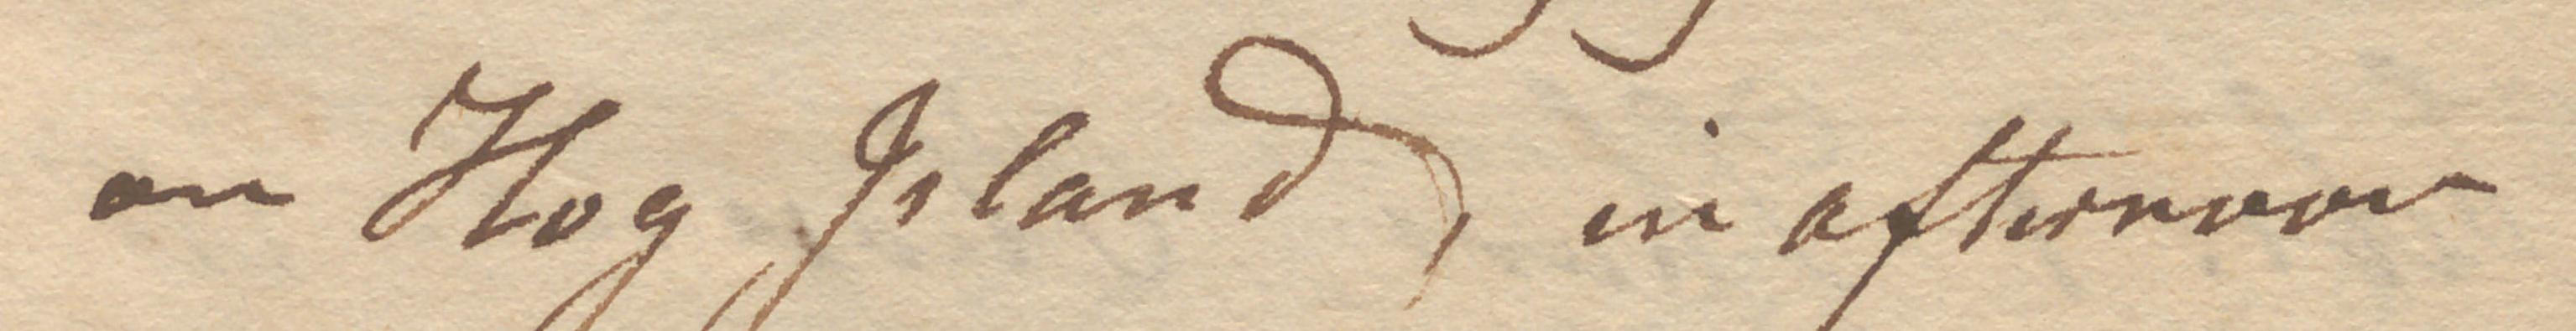on Hog Island, in afternoon
